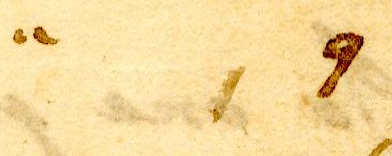- 9
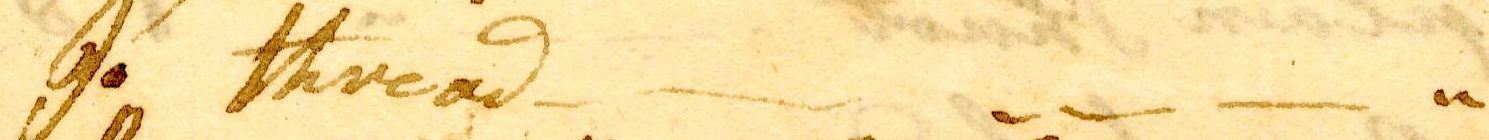To thread
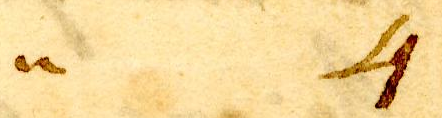- 4
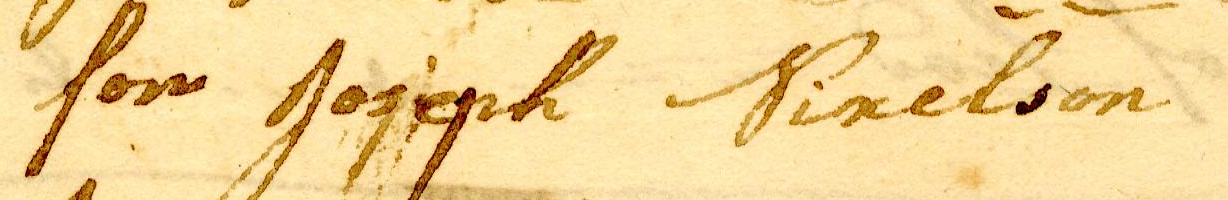for Joseph Pixelson
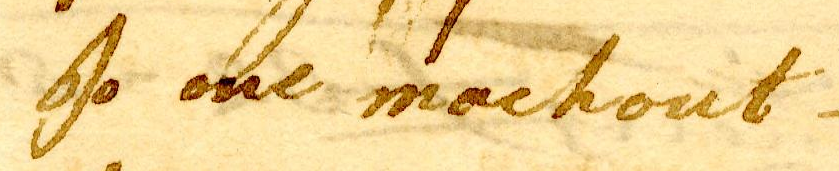To one machout
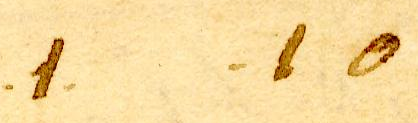1 - 10
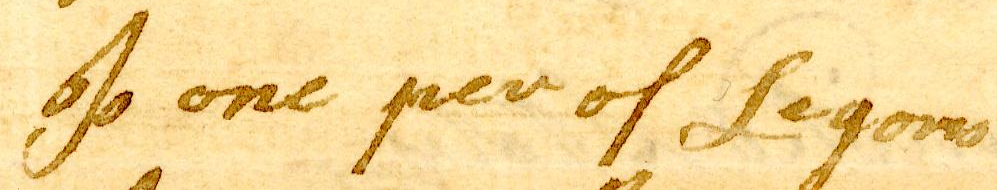To one per of Legons
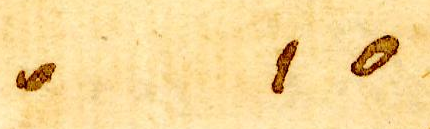- 10
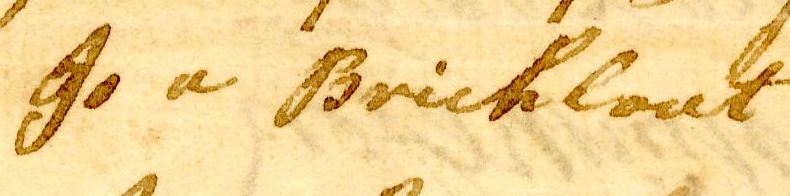To a Bricklout
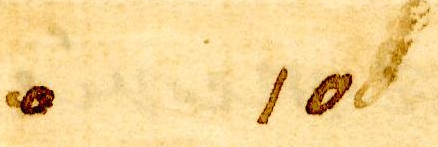- 10
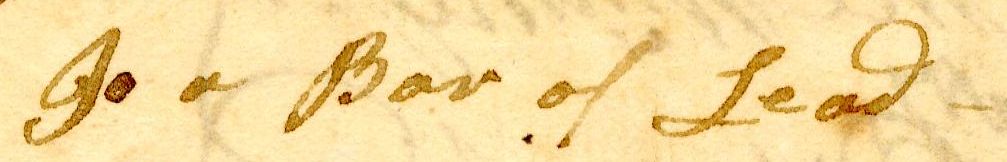To a Bar of Lead-
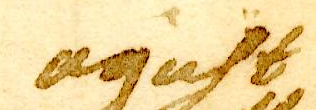agust
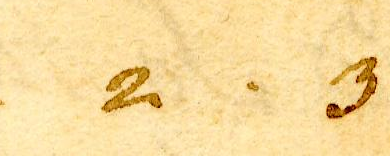- 2 - 3
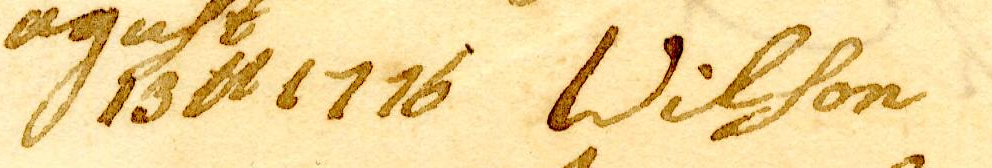13th 1776 Wilson
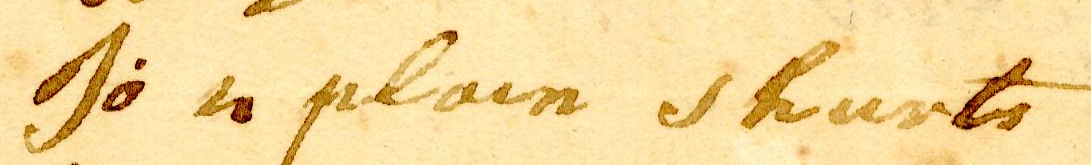To 4 plain shurts
